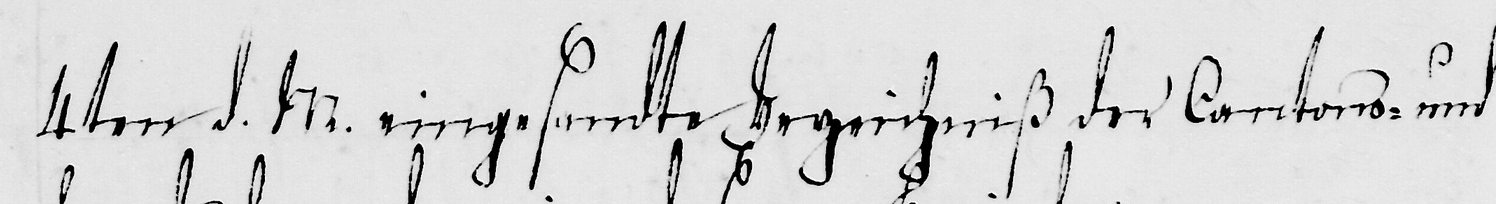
4ten d. M. eingesandte Verzeichniß der Cantons- und
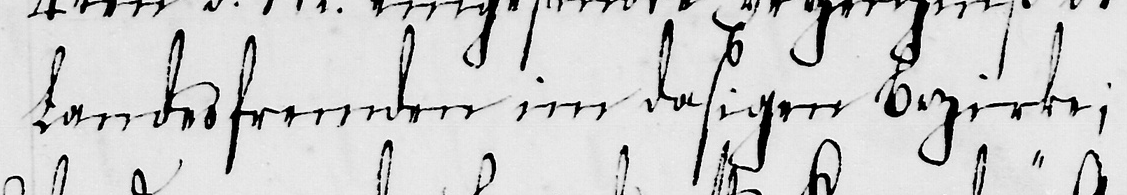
Landesfremden im dasigen Bezirke;
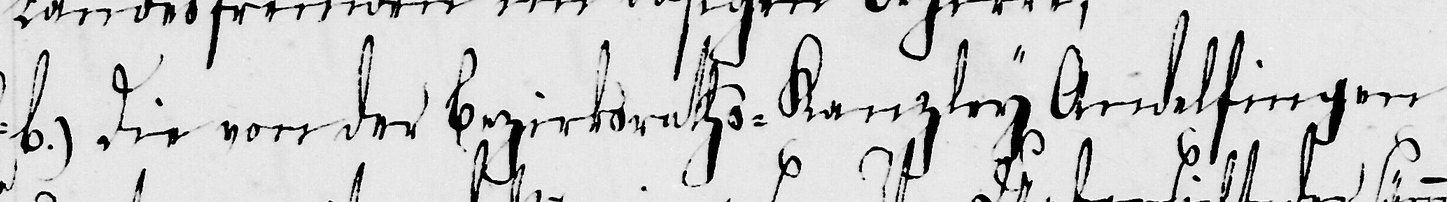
b.) Die von der Bezirksraths-Kanzley Andelfingen
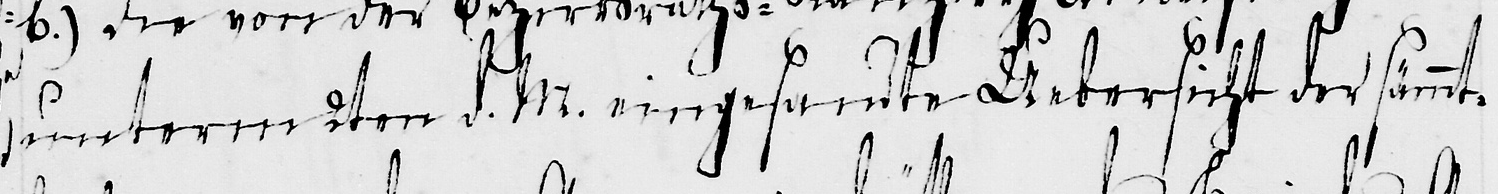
unterm 2ten d. M. eingesandte Uebersicht der sämmt¬
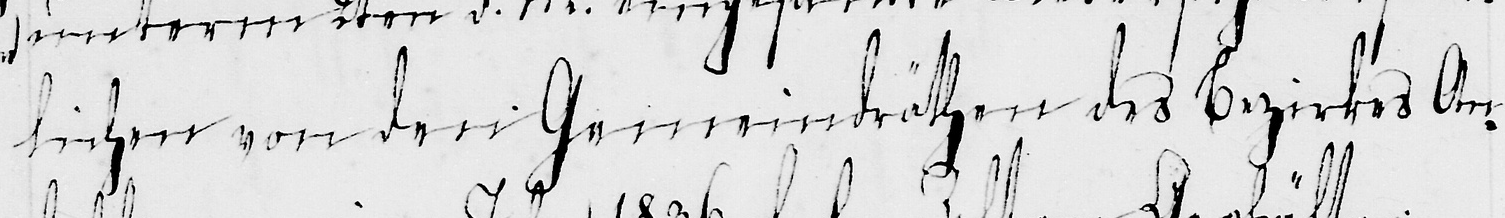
lichen von den Gemeindräthen des Bezirkes An¬
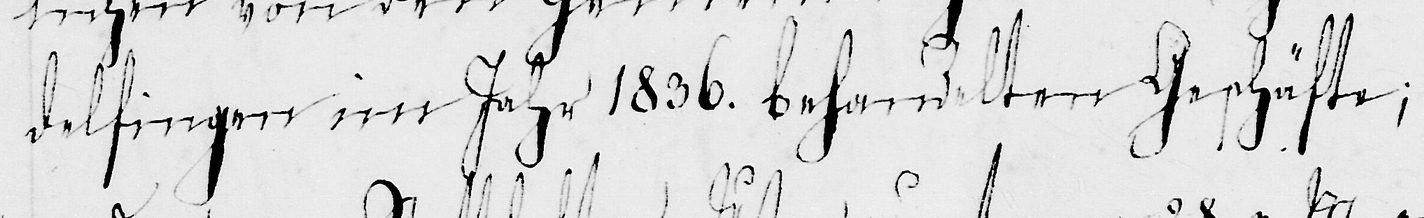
delfingen im Jahr 1836. behandelten Geschäfte;
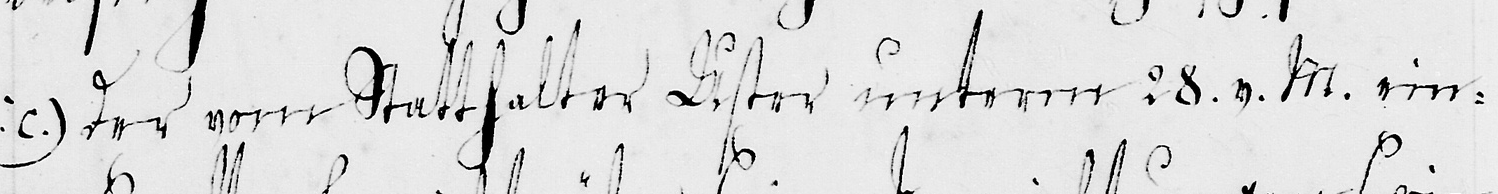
c.) Der vom Statthalter Uster unterm 28. v. M. ein¬
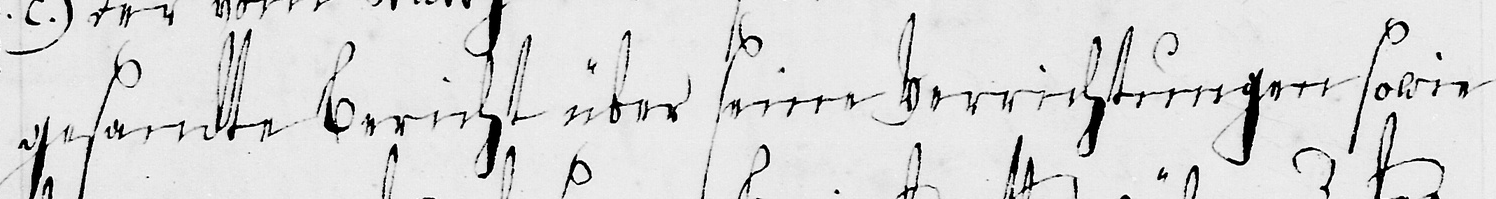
gesandte Bericht über seine Verrichtungen sowie
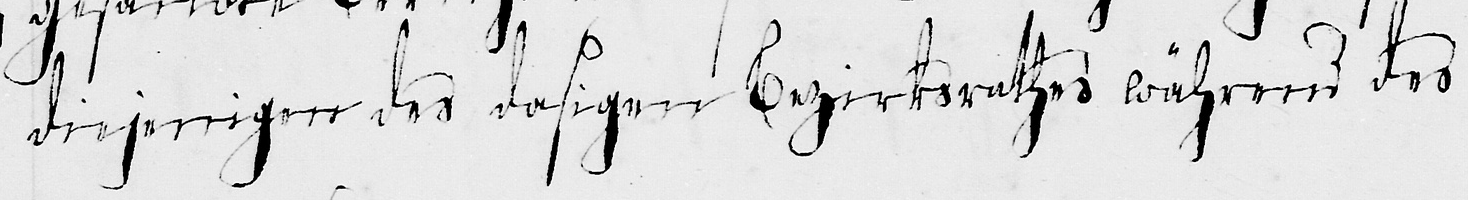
diejenigen des dasigen Bezirksrathes während des
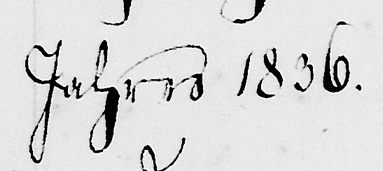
Jahres 1836.
